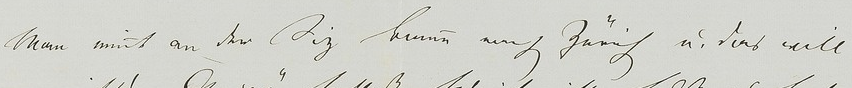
Man nimmt an der Siz komme nach Zürich u. das will
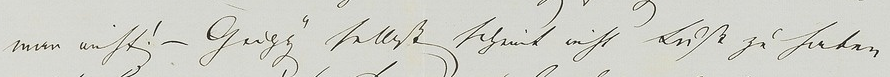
man nicht! – Geigy selbst scheint nicht Lust zu haben
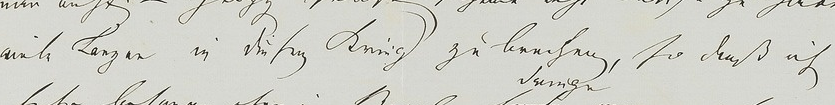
viele Lanzen in diesem Krieg zu brechen, so daß ich
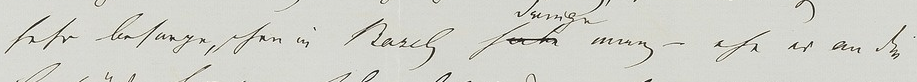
sehr besorge, schon in Baselhabedringe man – ehe es an die
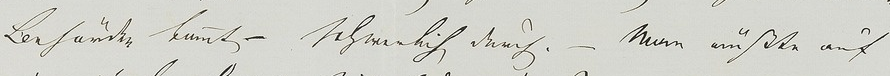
Behörden kommt – schwerlich durch. – Man müßte auf
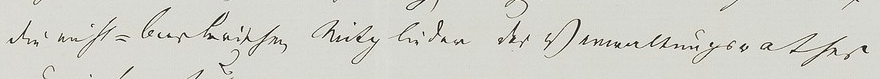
die nicht-baslerischen Mitglieder des Verwaltungsrathes
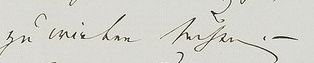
zu wirken suchen. –
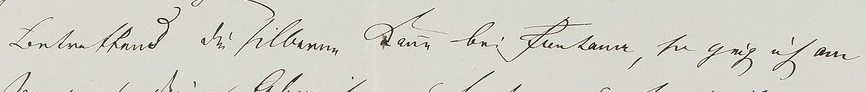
Betreffend die silberne Kanne bei Fontana, so ging ich am
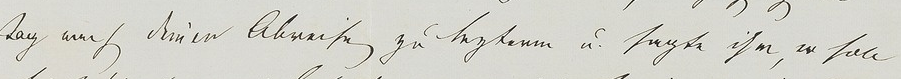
Tag nach deiner Abreise zu lezterm u. sagte ihm, er soll
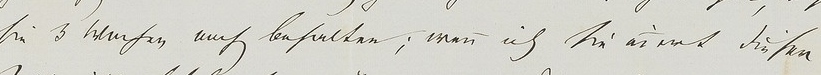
sie 3 Wochen noch behalten; wenn ich sie innert dieser
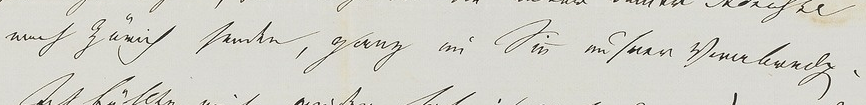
nach Zürich senden, ganz im Sinn unsrer Verabredg.
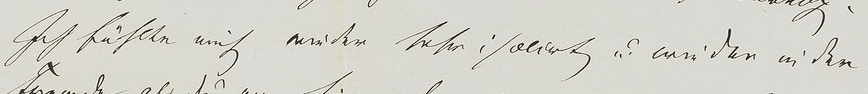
Ich fühlte mich wieder sehr isolirt u. wieder in der
